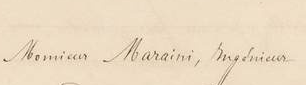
Monsieur Maraini, Ingénieur
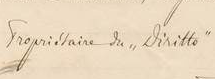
Propriétaire du «Diritto»
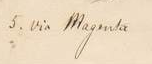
5. Via Magenta
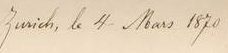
Zurich, le 4 Mars 1870
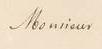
Monsieur
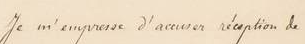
Je m'empresse d'accuser réception de
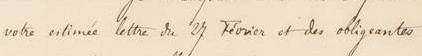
votre estimée lettre du 27 Février et des obligeantes
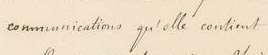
communications qu'elle contient.
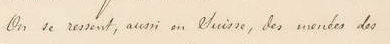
On se ressent, aussi en Suisse, des menées des
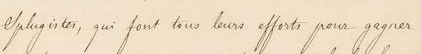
Splugistes, qui font tous leurs efforts pour gagner
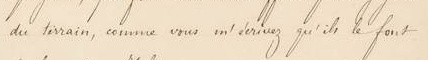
du terrain, comme vous m'écrivez qu'ils le font
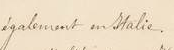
également en Italie.
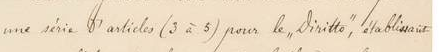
une série d'articles (3 à 5) pour le «Diritto», établissant
